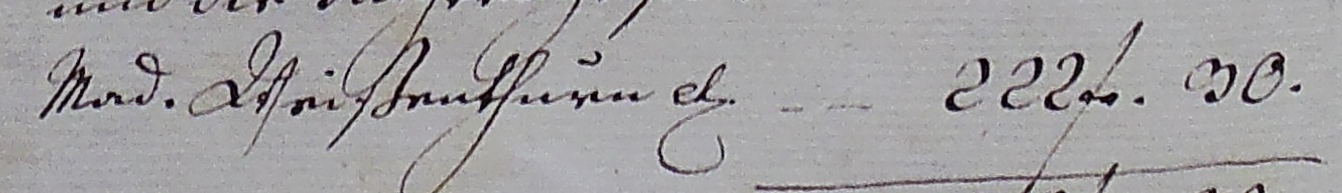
Mad. Weißenthurn etz. 222fr. 30.
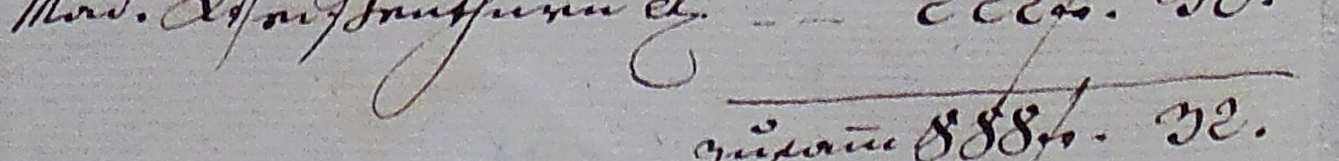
-----------------------
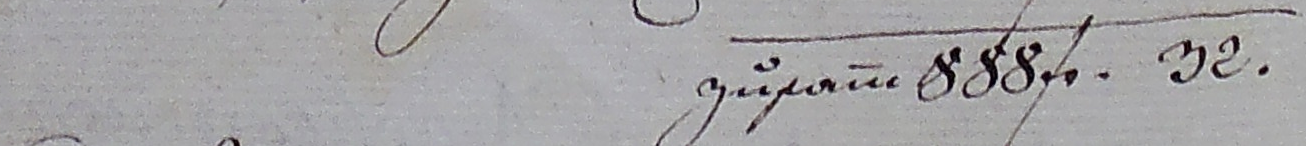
zusam̅ 888fr. 32.
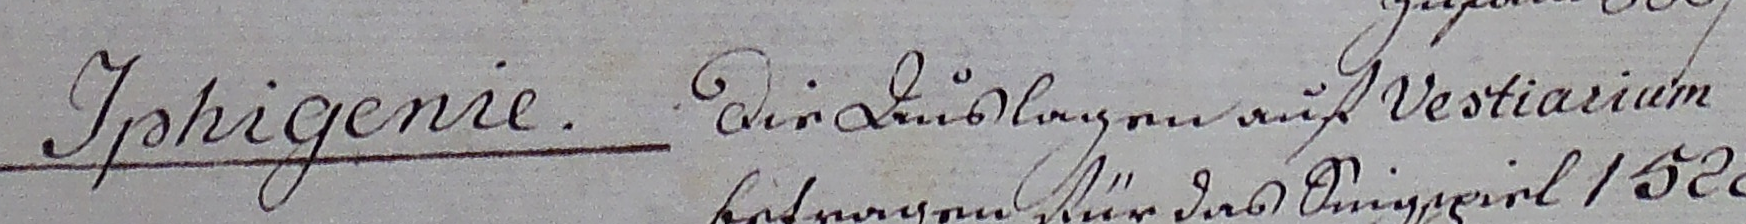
Iphigene. Die Auslagen auf Vestiarium
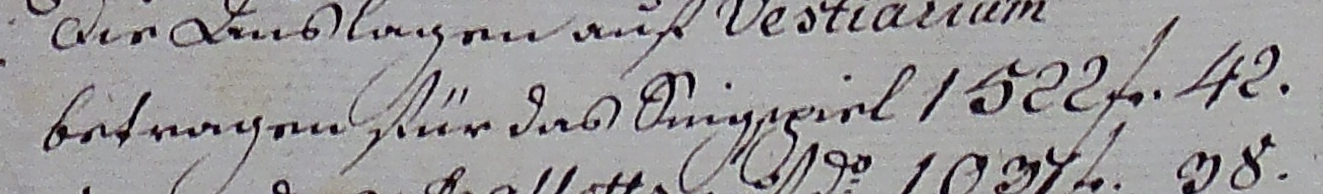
betragen für das Singspiel 1522fr. 42.
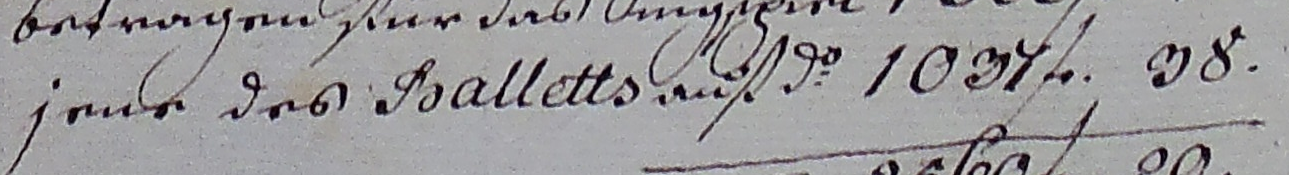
jene des Balletts auf do͇ 1037fr. 38.
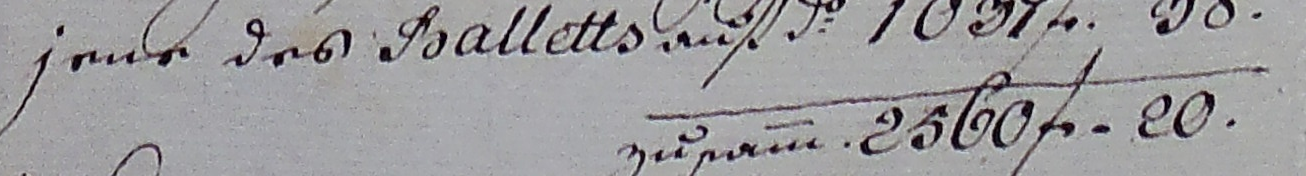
-------------------------------
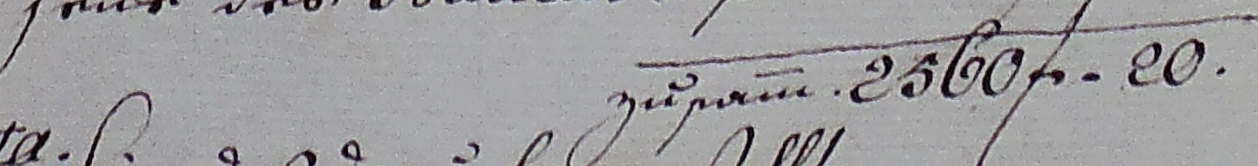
zusam̅. 2560fr. 20.
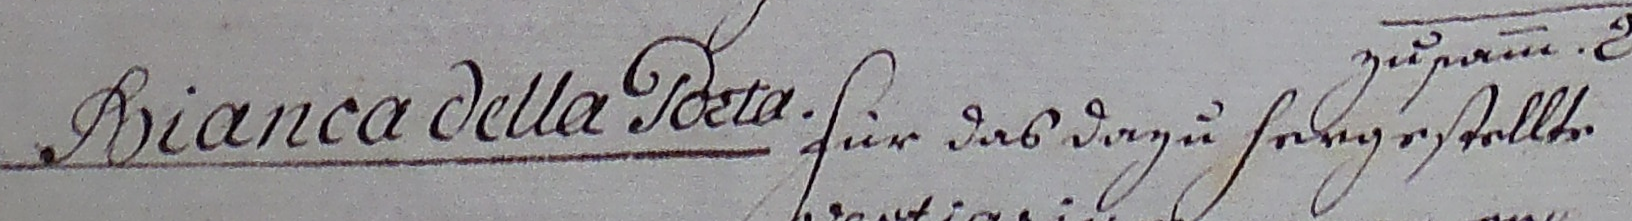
Bianca della Porta Für das dazu freygestellte
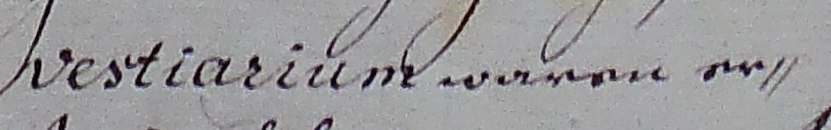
vestiarium waren er¬
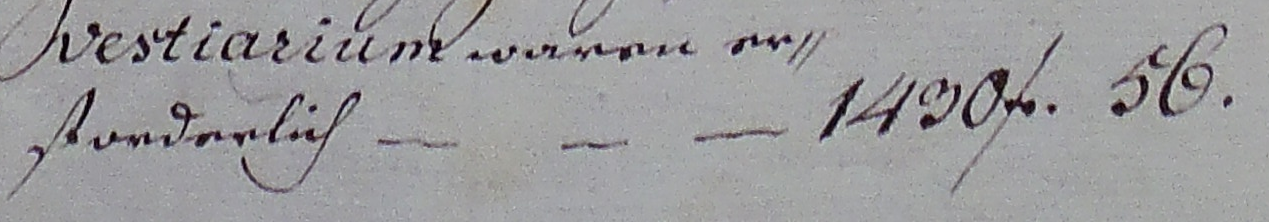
forderlich _ _ __ ____ 1430fr. 56.
